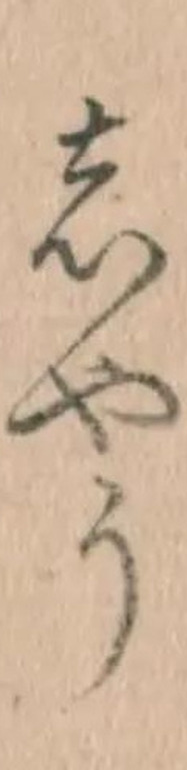しやう
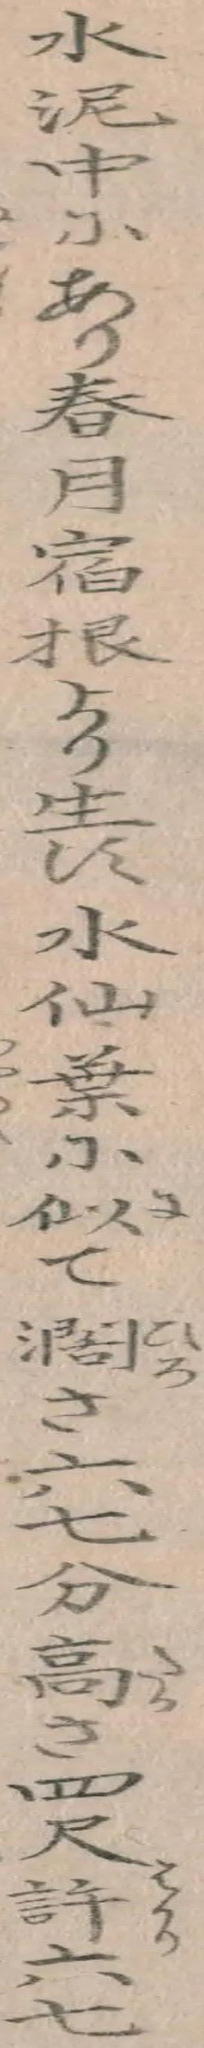水泥中にあり春月宿根より生す水仙葉に似て闊さ六七分高さ四尺許六七
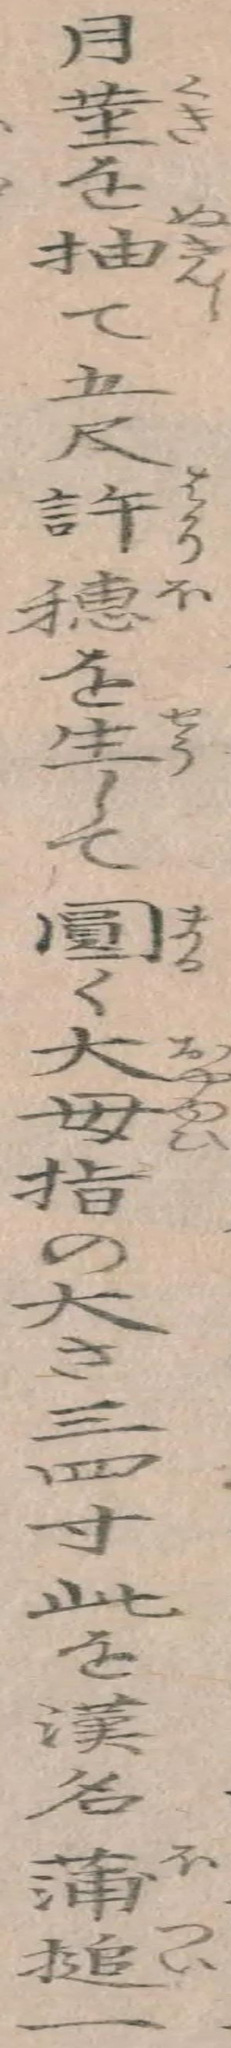月茎を抽て五尺許穂を生して円く大母指の大さ三四寸此を漢名蒲槌一
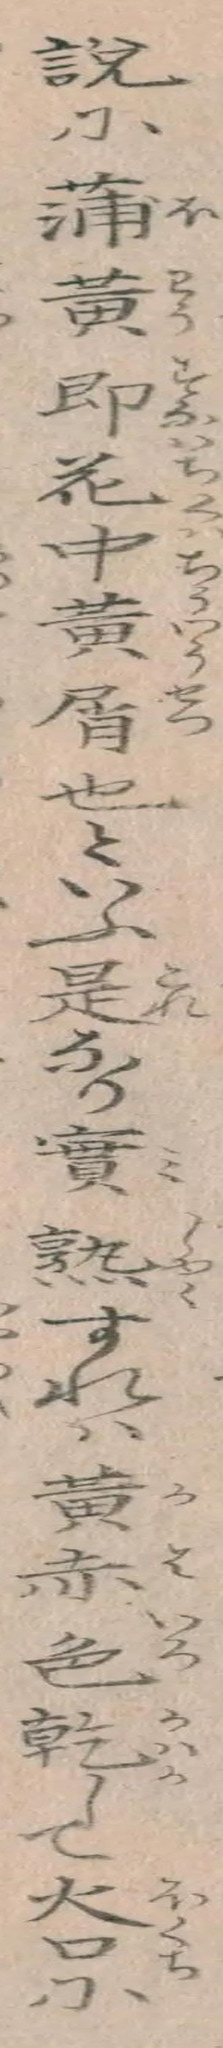説に蒲黄即花中黄屑也という是なり実熟すれは黄赤色乾して火口に

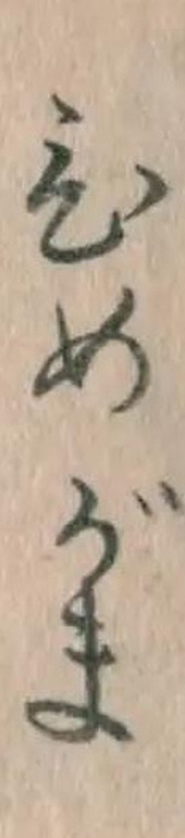ひめがま
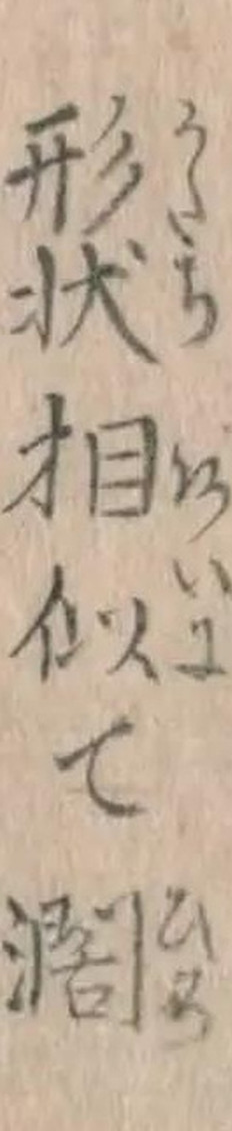形状相似て闊
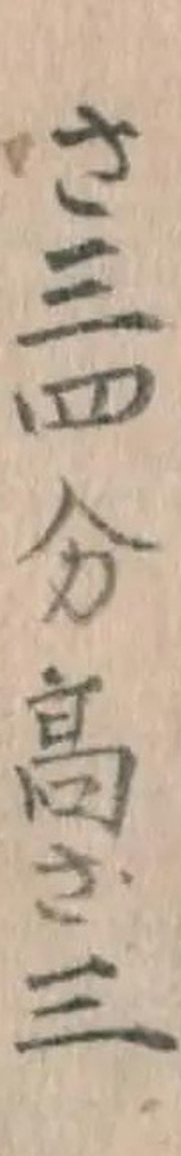さ三四分高さ三
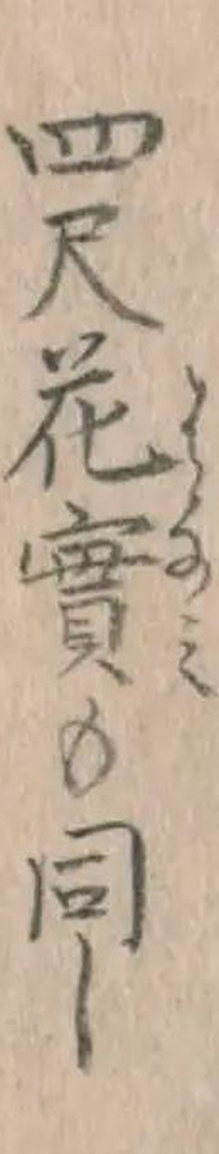四尺花実も同し

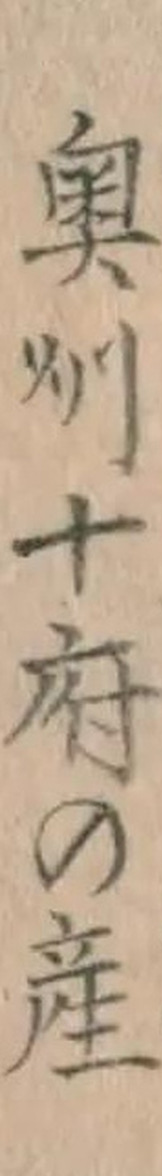奥州十府の産
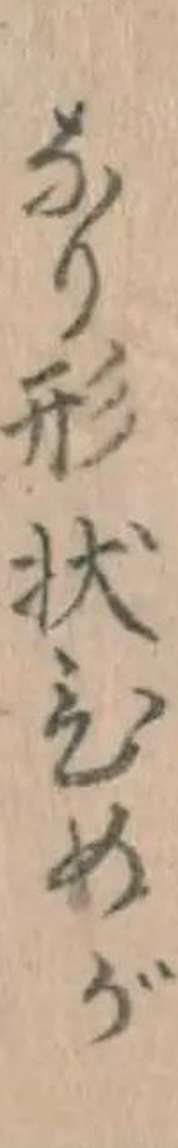なり形状ひめが
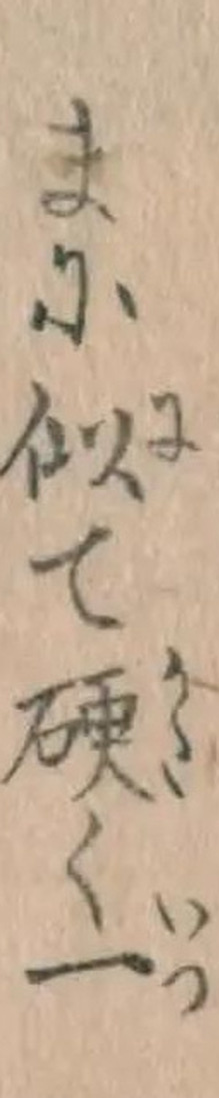まに似て硬く一
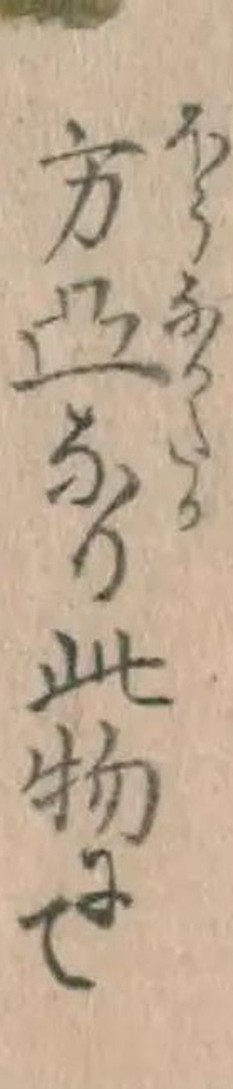方凸なり此物にて
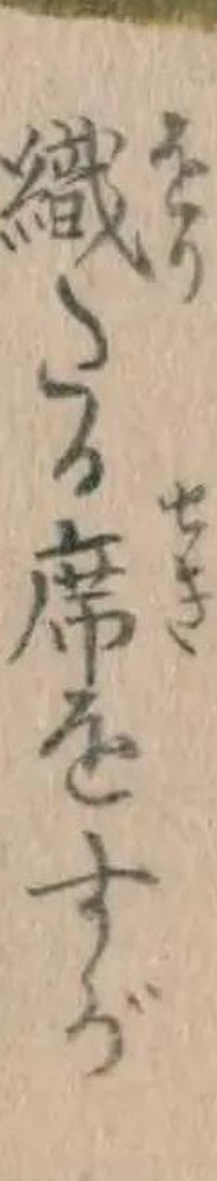織たる席をすが
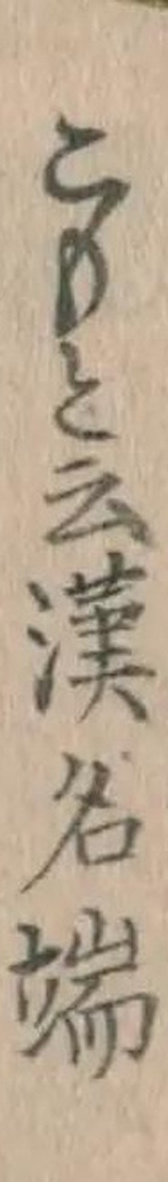こもと云漢名端
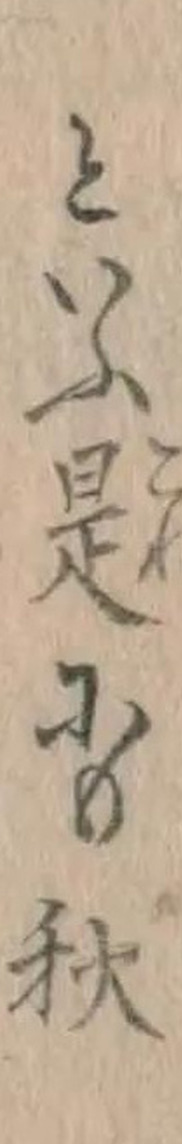といふ是にも秋
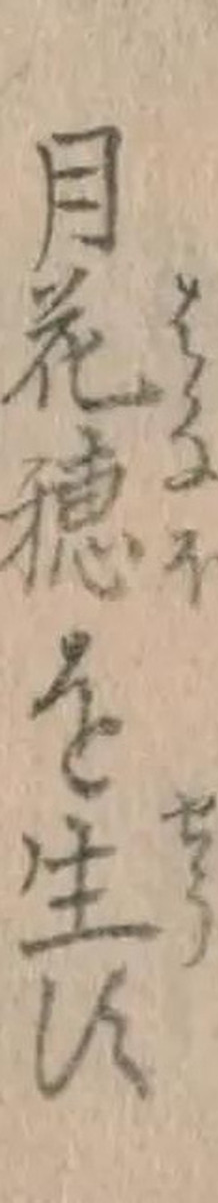月花穂を生す
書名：本草図譜. 巻31-33
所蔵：国立国会図書館 National Diet Library, JAPAN
